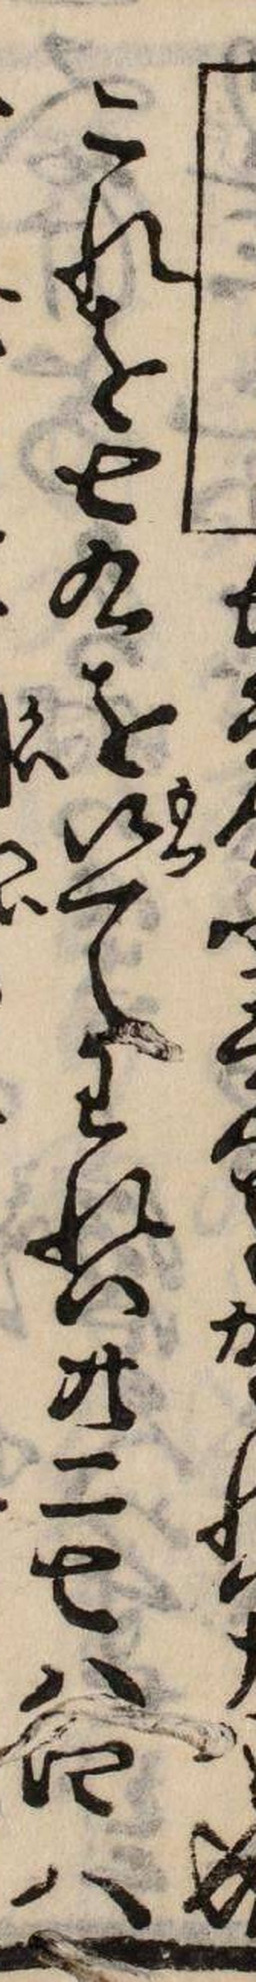これを七九を以てわれは廿二七八四八
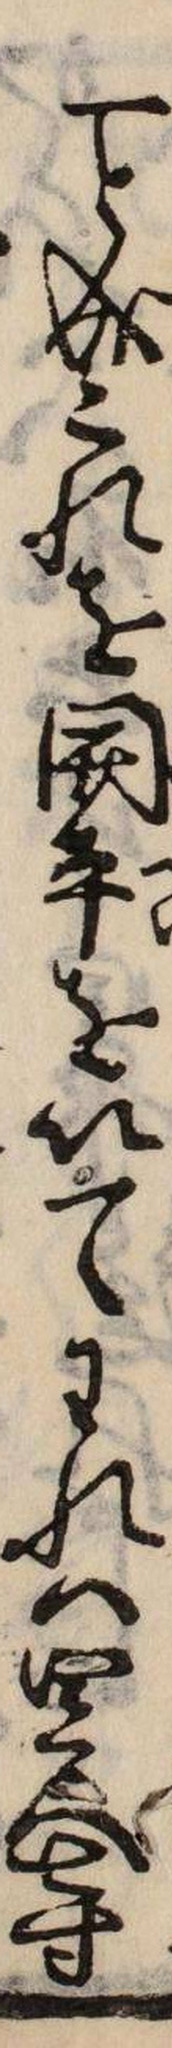一と成これを開平を以てわれは四尺七寸
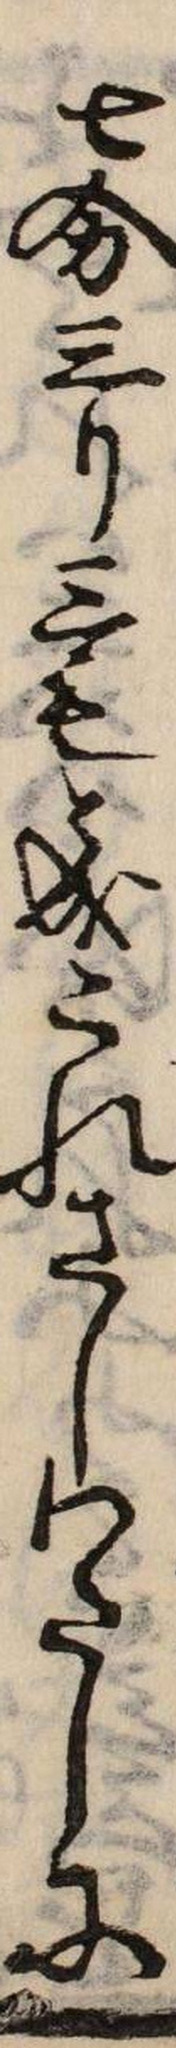七分三り三毛と成これさしわたしに
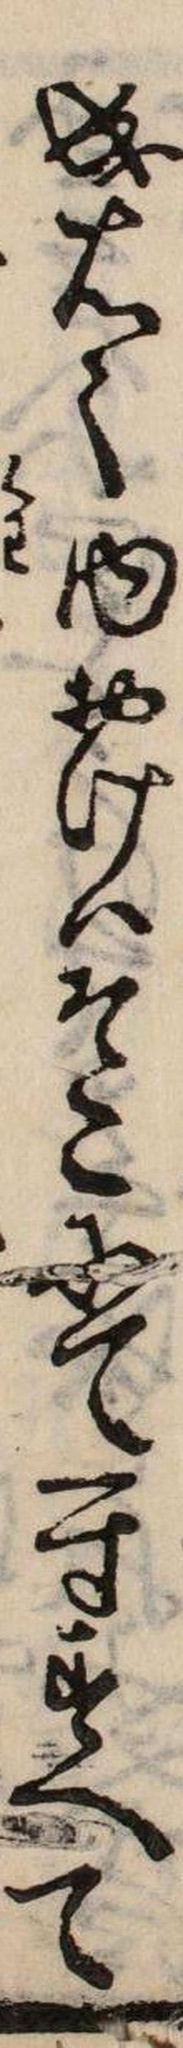成右之内おけはそこにて一寸すへて
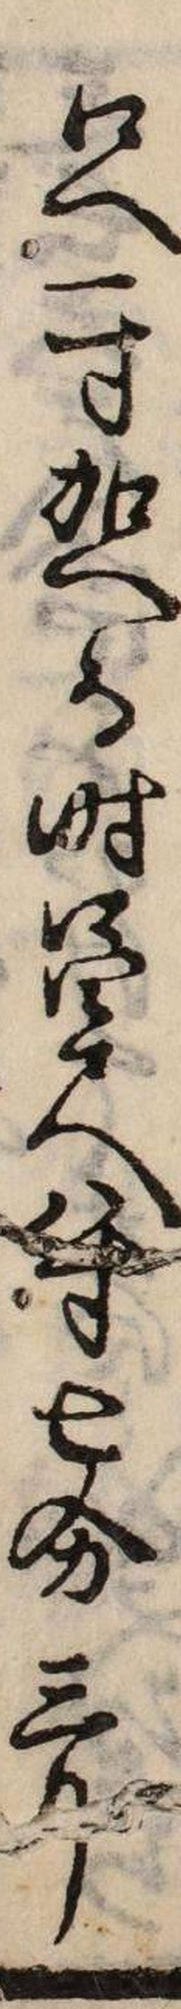口へ一寸加へる時口四尺八寸七分三り
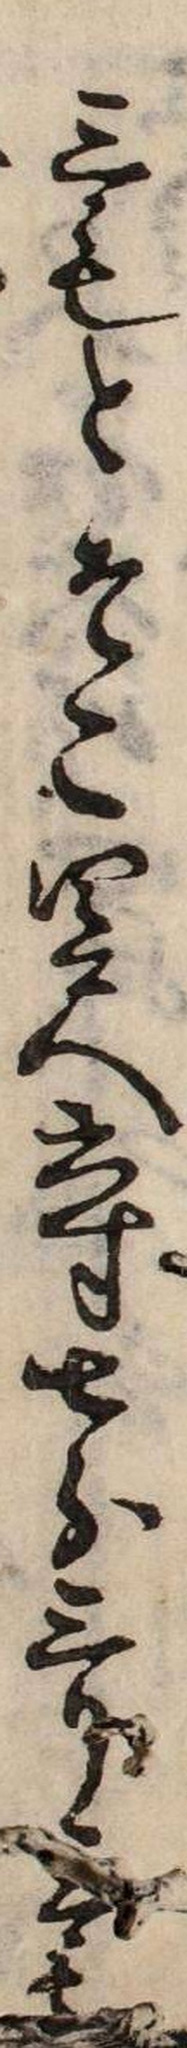三毛とそこ四尺六寸七分三り三毛
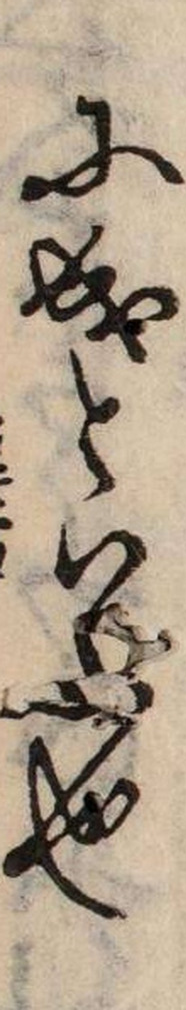に成といふ也

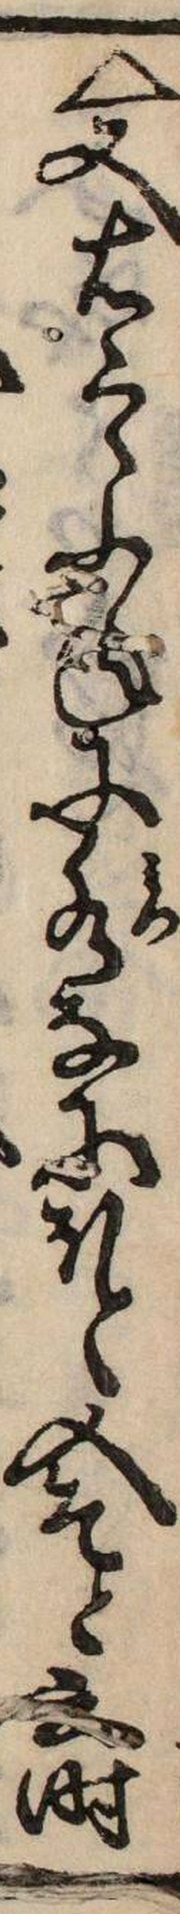△又右之ふねに水なにほと入そと云時
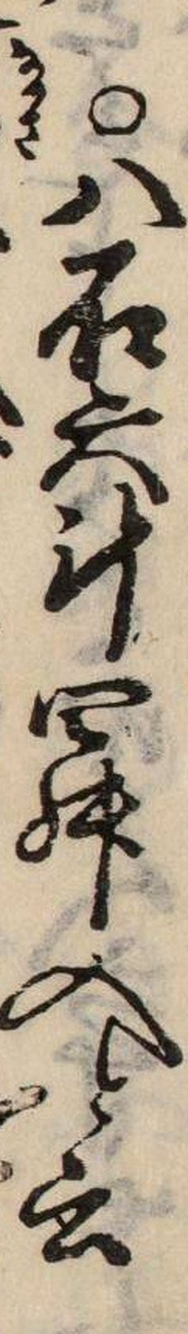○八石六斗四升入と云
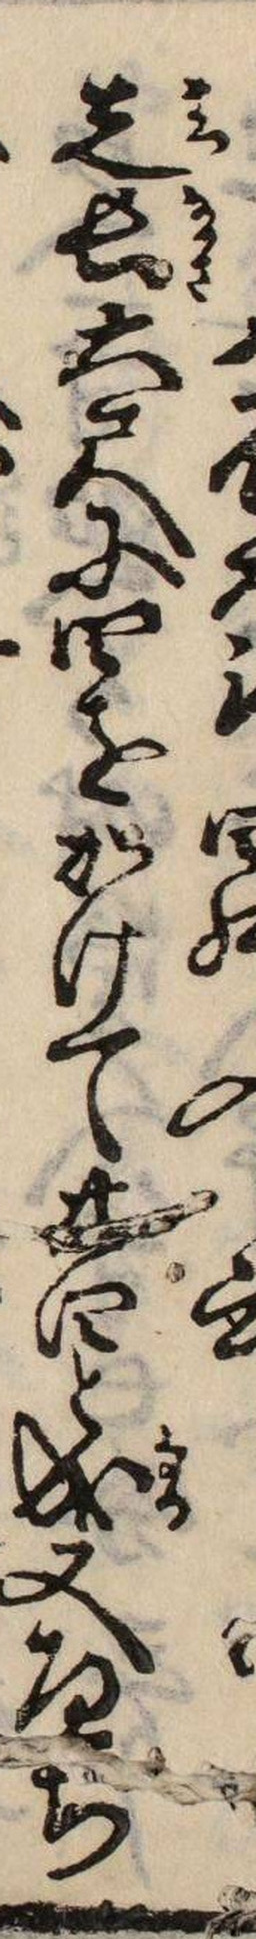先長六尺に四をかけて廿四と成又へち
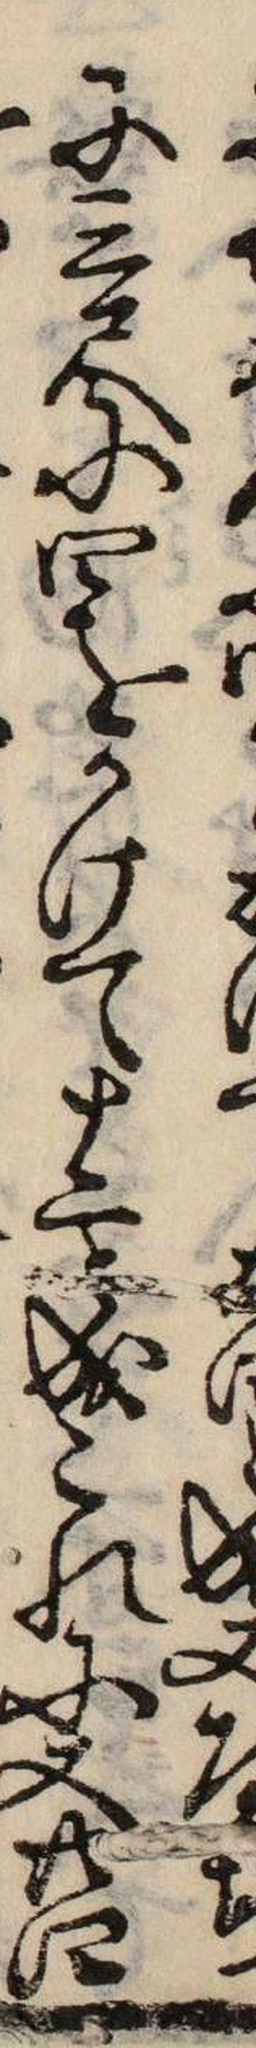に三尺に四をかけて十二と成これに又廿四
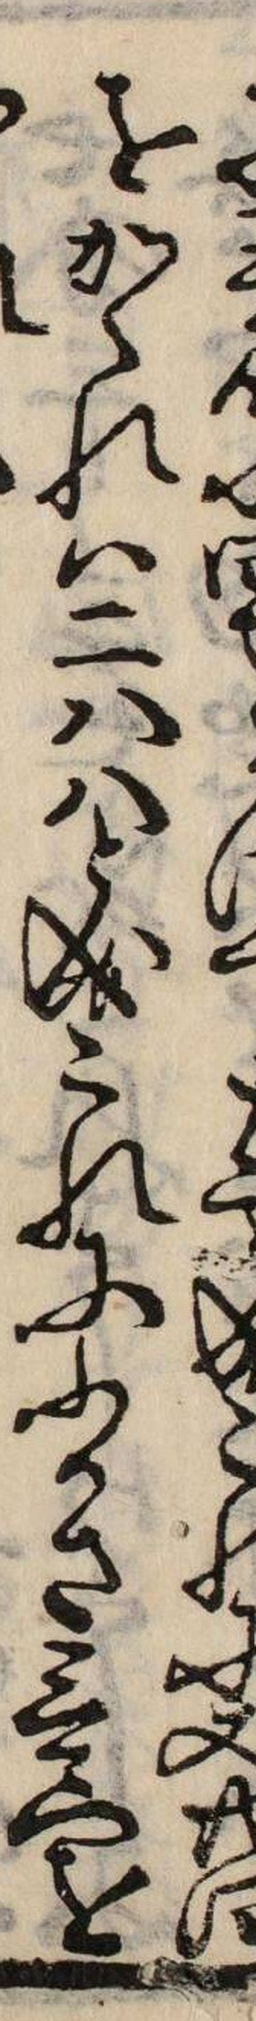をかくれは二八八と成これにふかさ三尺を
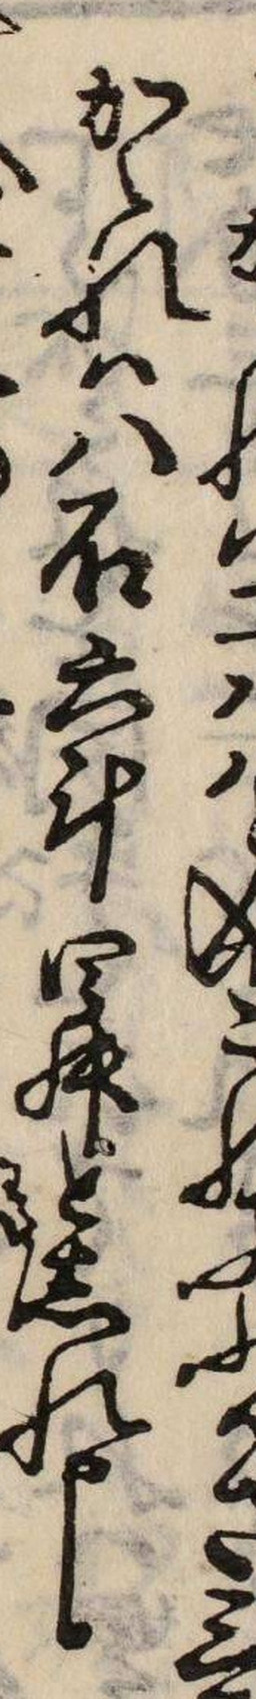かくらハ八石六斗四升としれ申候
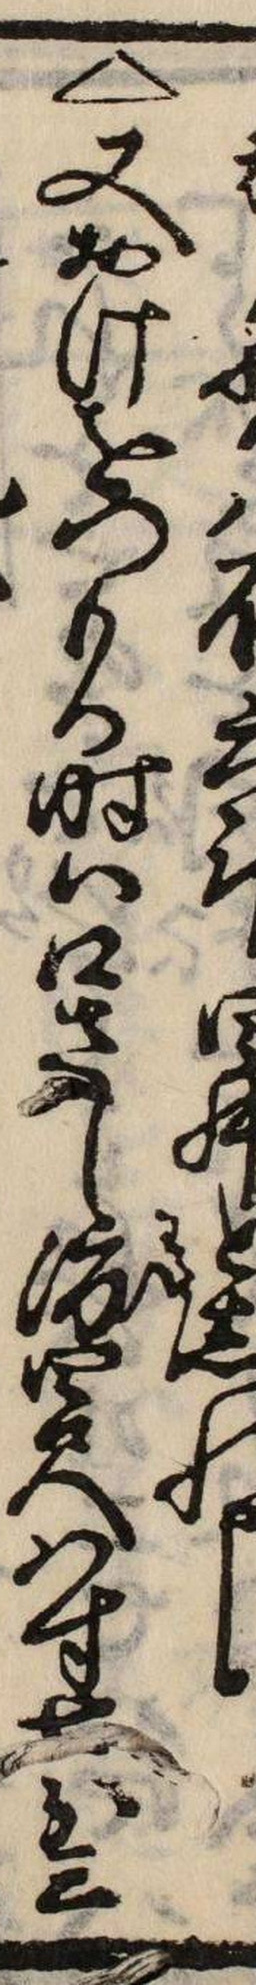△又おけをつもる時は口さし渡四尺六寸七分三
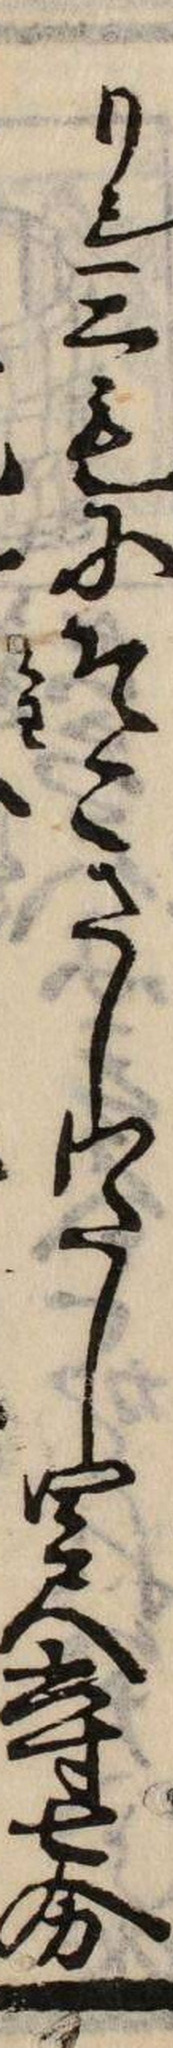りん三毛にそこさしわたし四尺六寸七分
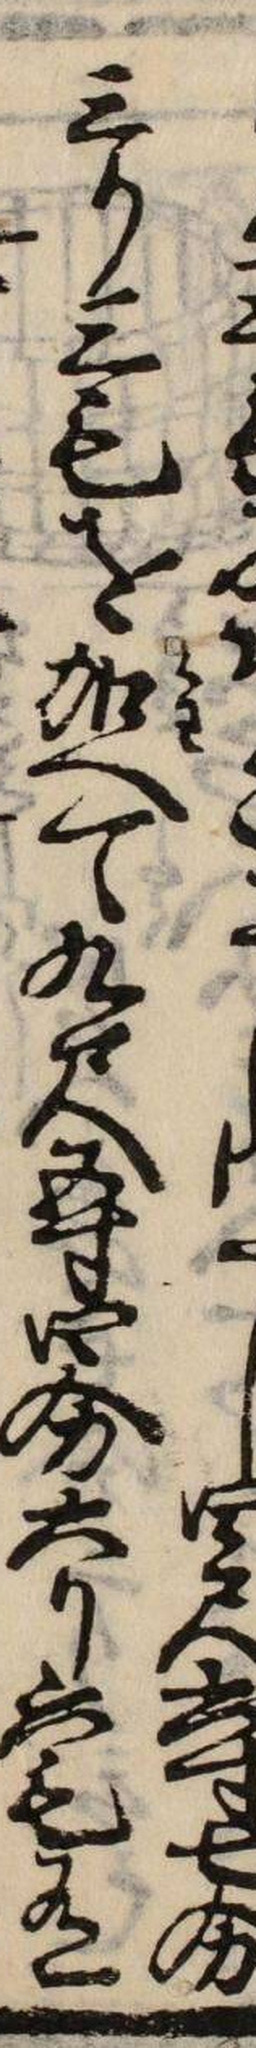三り三毛を加へて九尺五寸四分六り六毛有
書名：塵劫記（寛永11年自跋、京都府立京都学・歴彩館追貴8）
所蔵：京都府立京都学・歴彩館 国文学研究資料館
